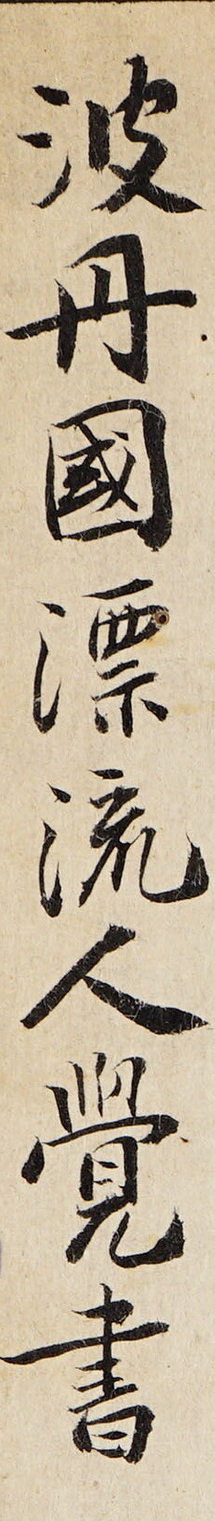波丹国漂流人覚書

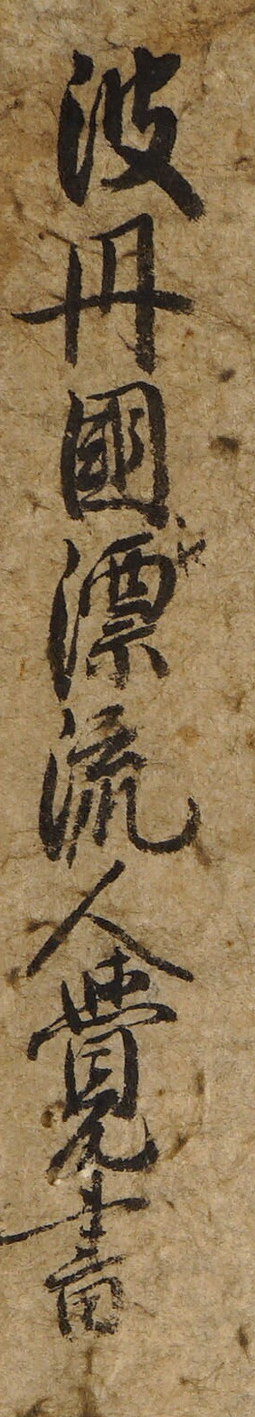波丹国漂流人覚書

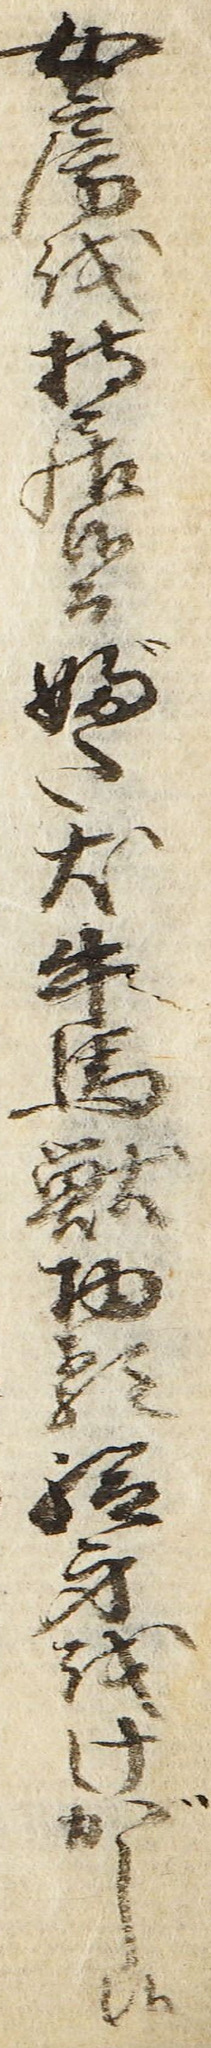女房を持居候而ぶた犬牛馬獣類給身をけがし候
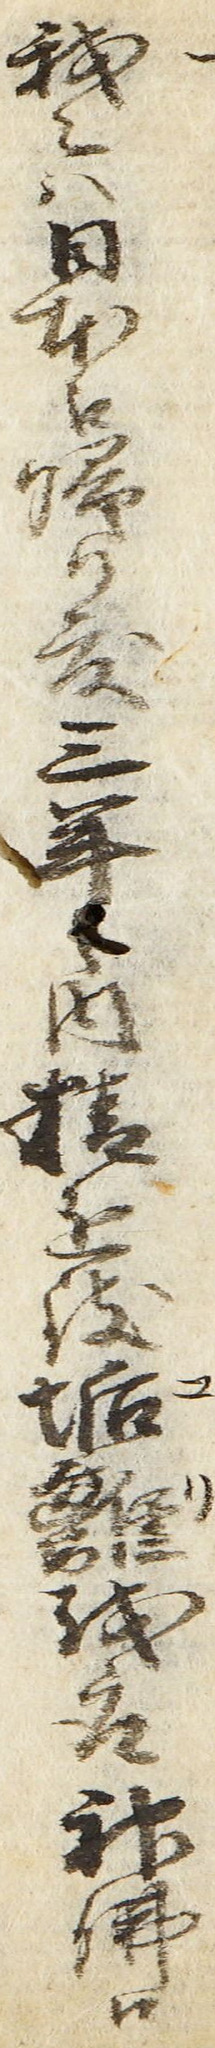我々ハ日本江帰り度三年之内精進致垢離を取神仏江
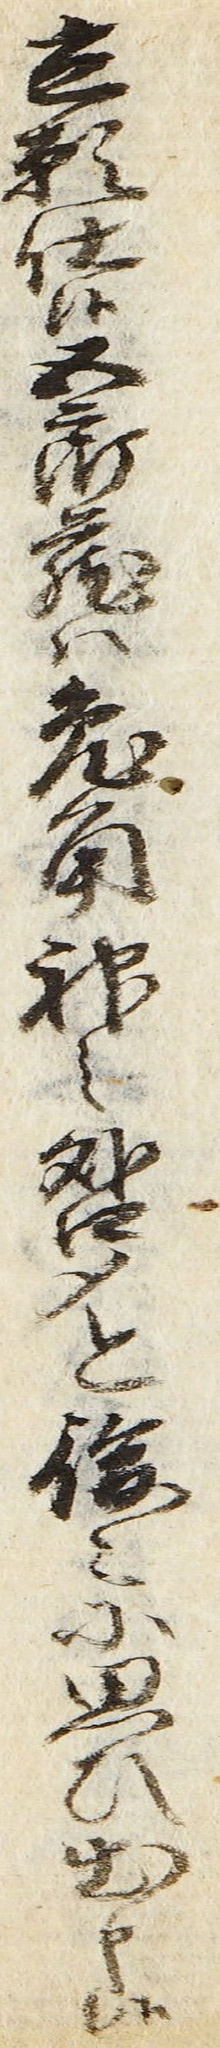立願仕候五郎蔵ハ兎角神之咎メと後々に思ひ出申候
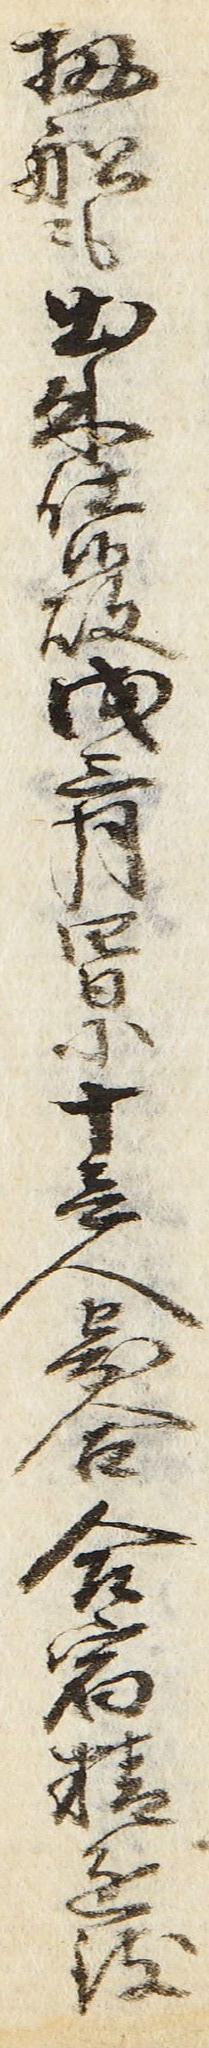扨船も出来仕候故戌三月四日に十壱人寄合合宿精進致
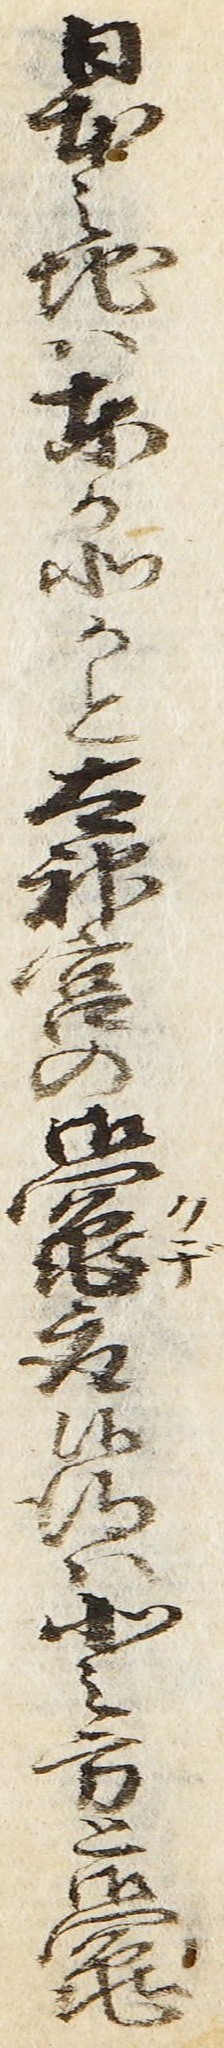日本之地ハ東か北かと太神宮の御鬮取候得ハ北之方と御鬮
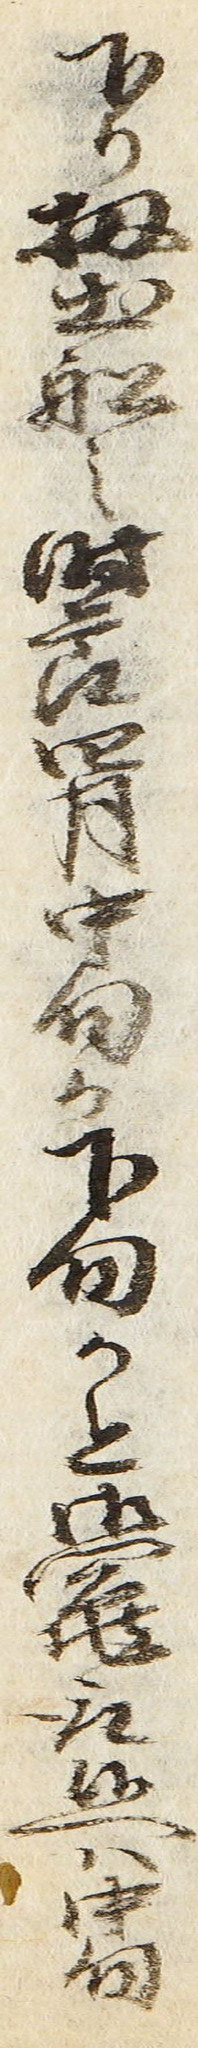下り扨出船之時節四月中旬か下旬かと御鬮取候へハ中旬
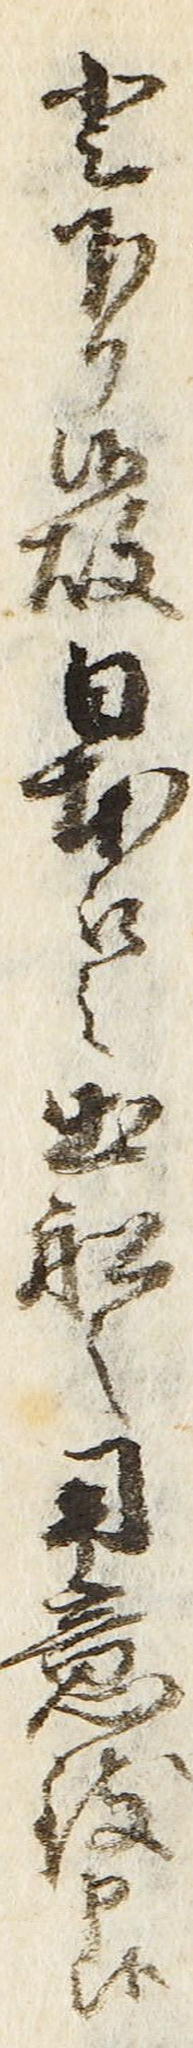と下り候故日本江之出船之用意致申候
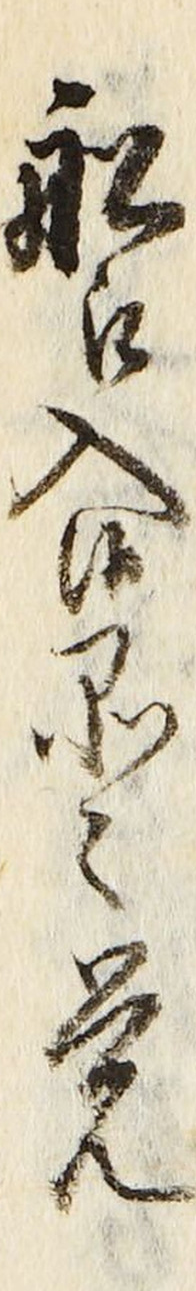船江入候品々覚
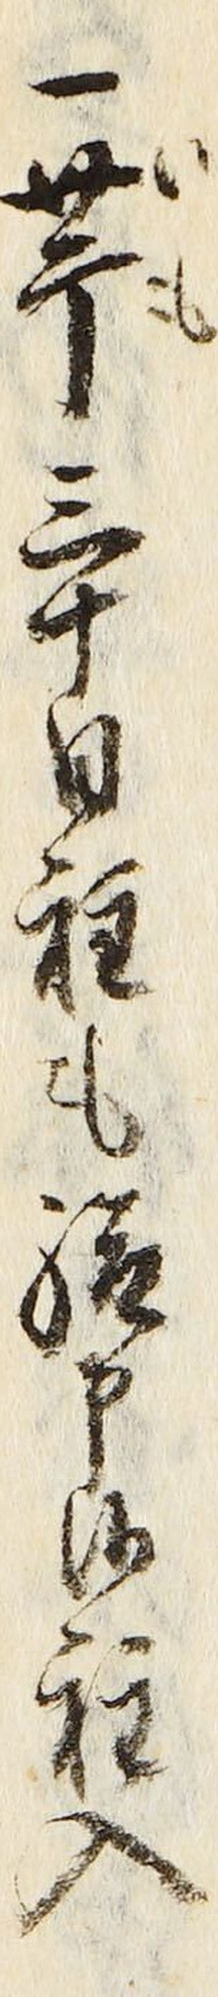一芋三十日程も給申候程入
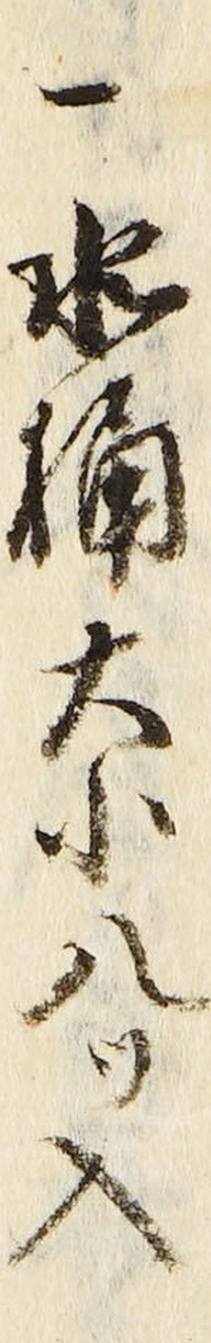一水桶大小八ツ入
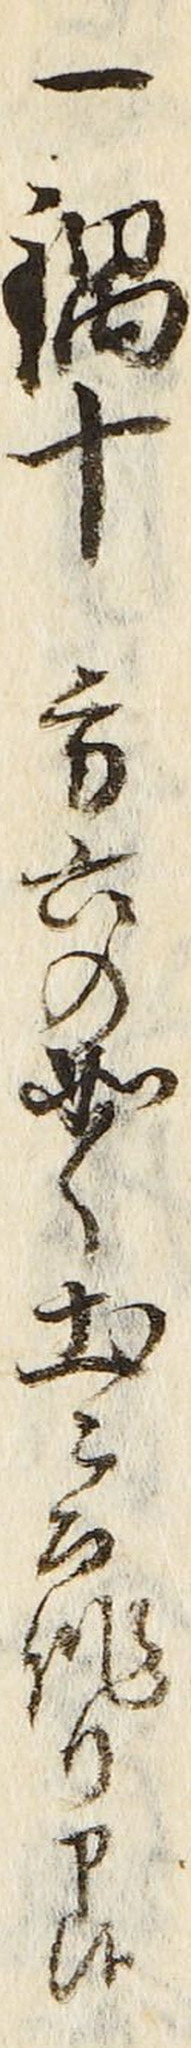一鍋十方六の如く土ニ而作り申候
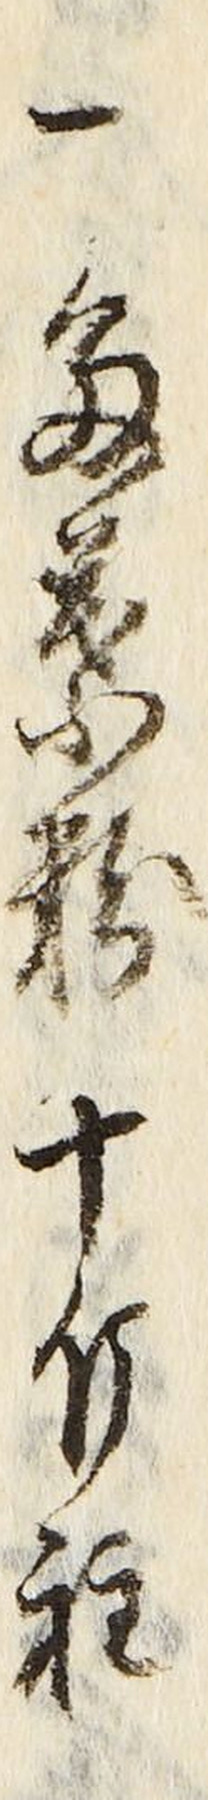一た葉粉十斤程
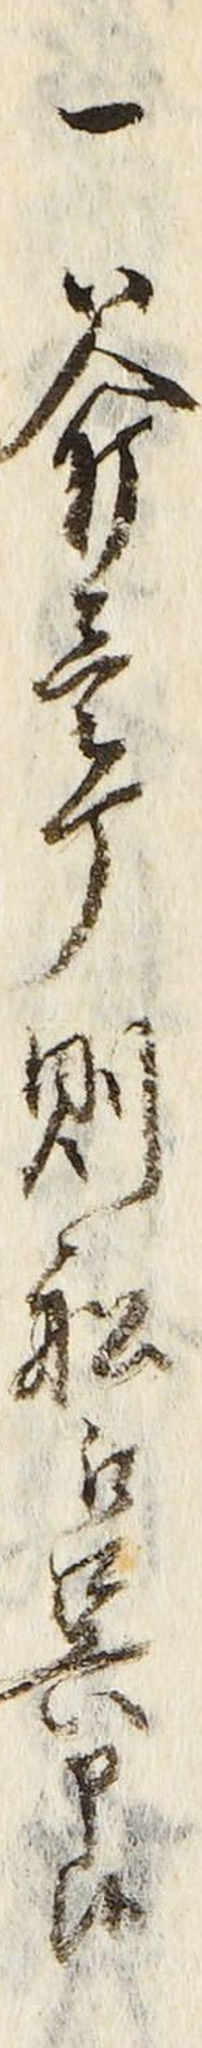一斧壱丁則船江呉申候
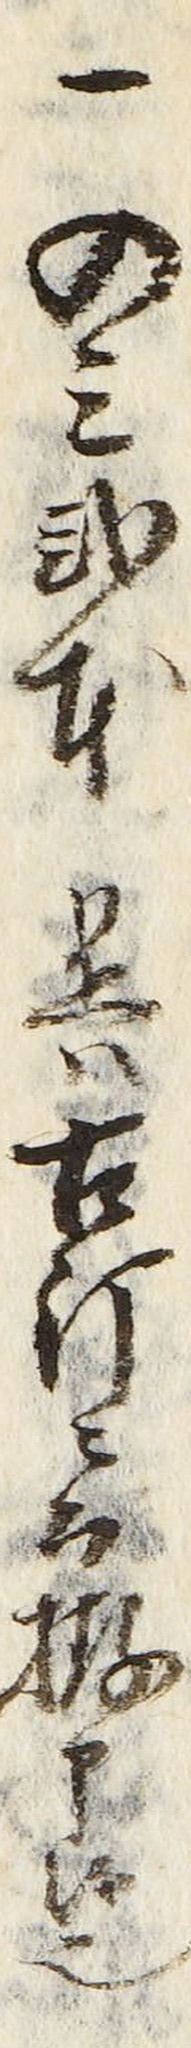一のミ弐本是ハ古釘ニ而拵申候也
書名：波丹国漂流人覚書
